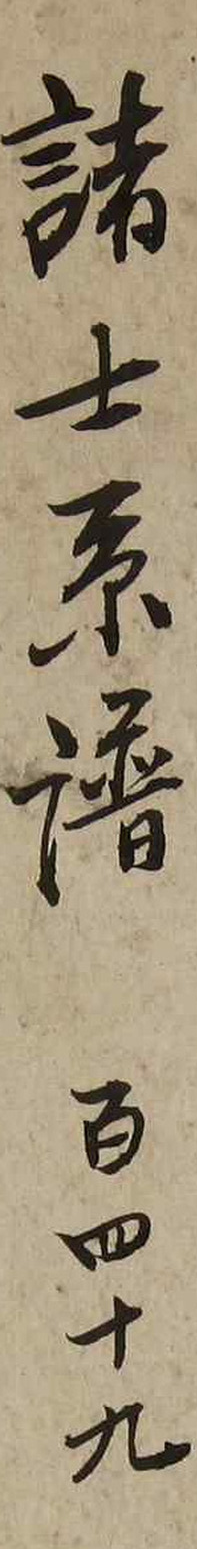諸士系譜百四十九

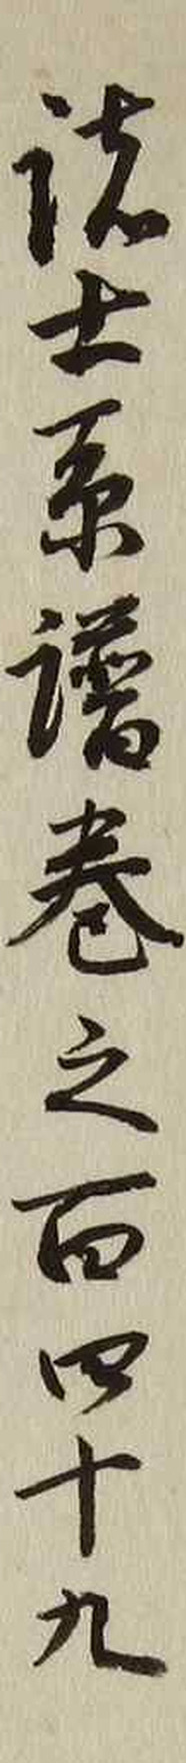諸士系譜巻之百四十九
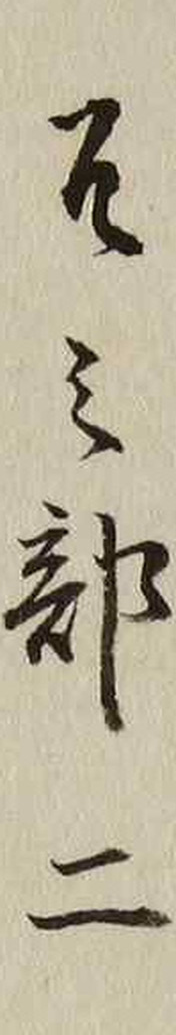そ之部二
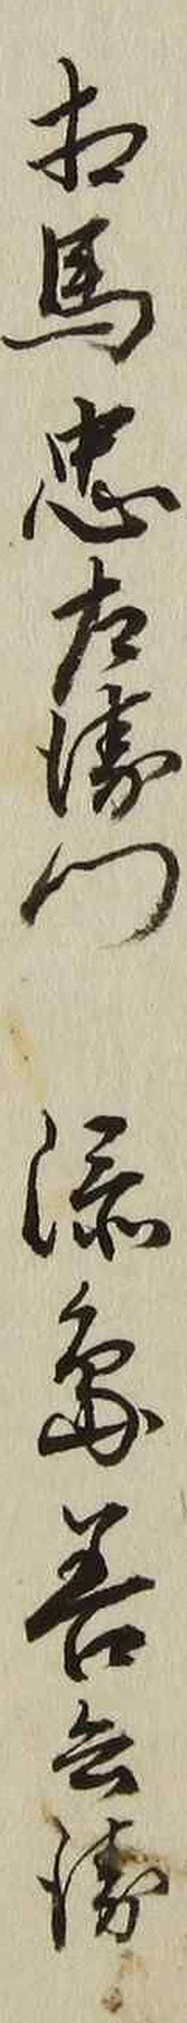相馬忠左衛門添島善兵衛

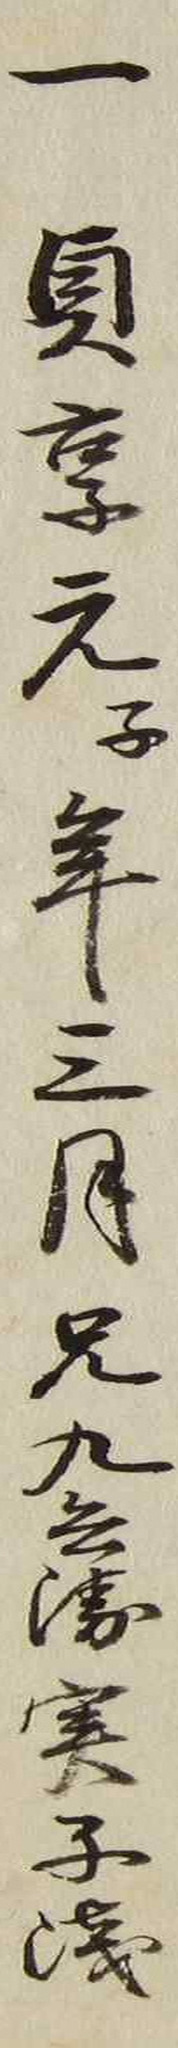一貞享元子年三月兄九兵衛実子浅
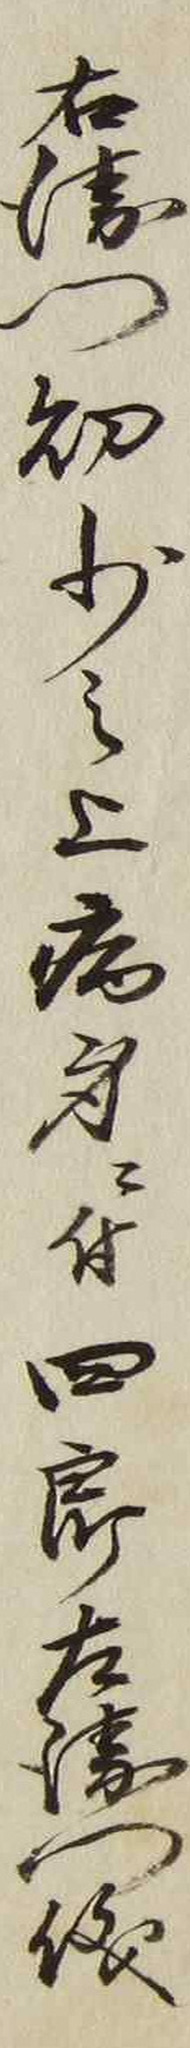右衛門幼少之上病身ニ付四郎左衛門儀

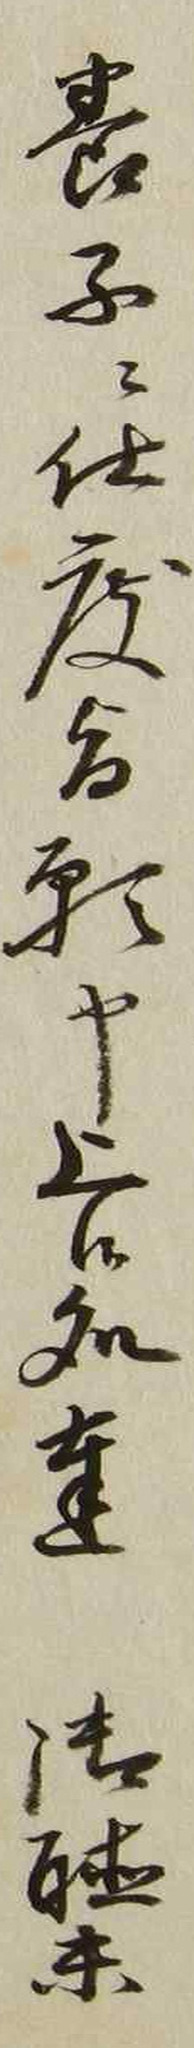養子ニ仕度旨願申上候処達御聴未
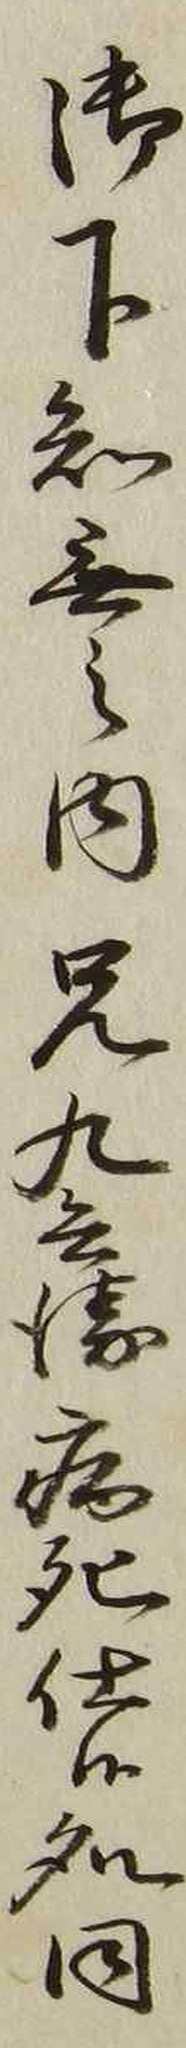御下知無之内兄九兵衛病死仕候処同
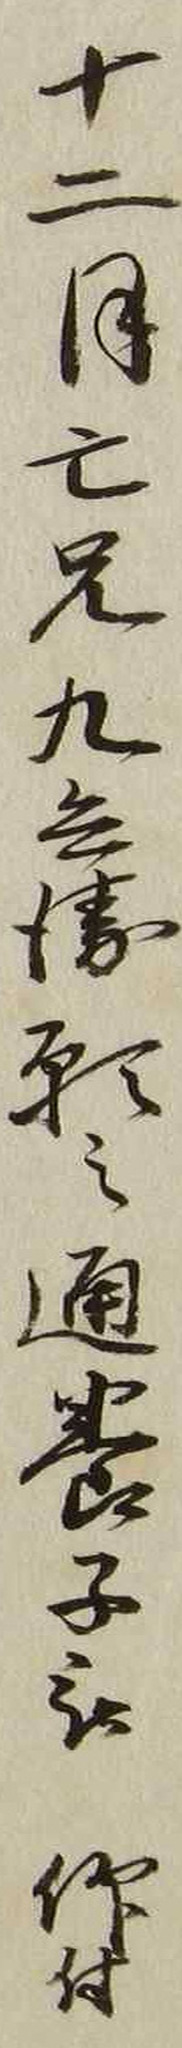十二月亡兄九兵衛願之通養子被仰付
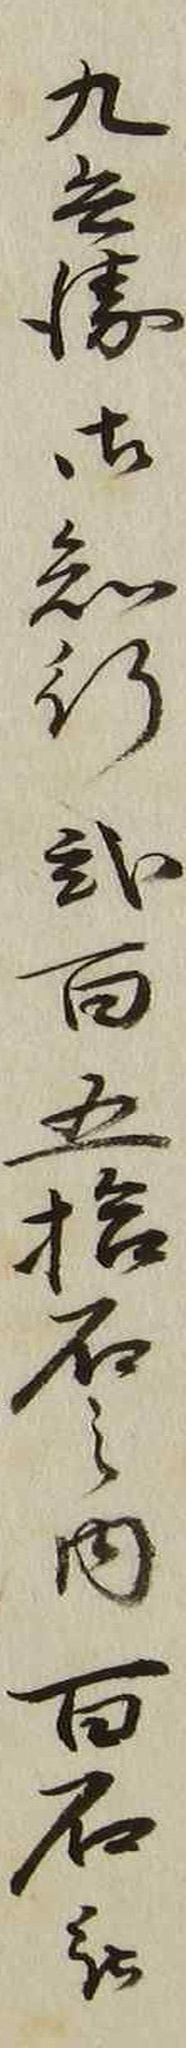九兵衛御知行弐百五拾石之内百石被
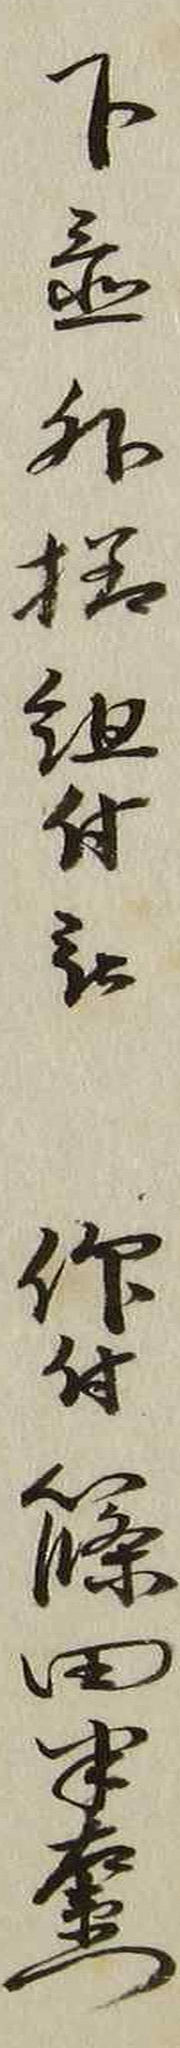下置外様組付被仰付篠田半右衛門
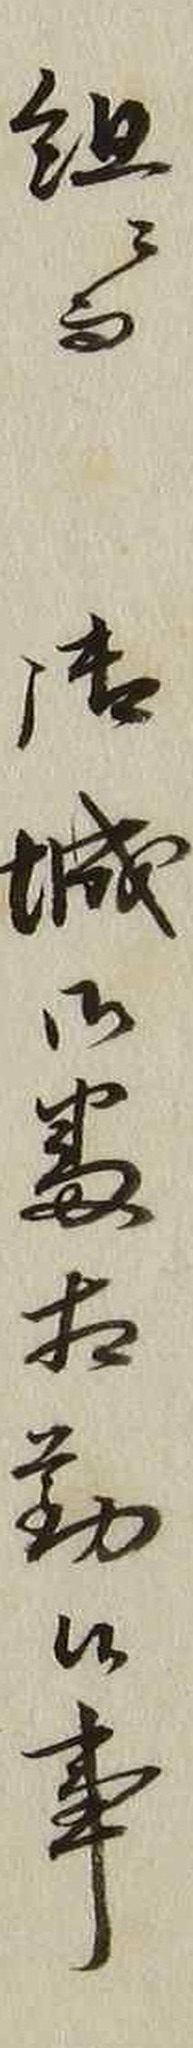組ニ而御城御番相勤候事
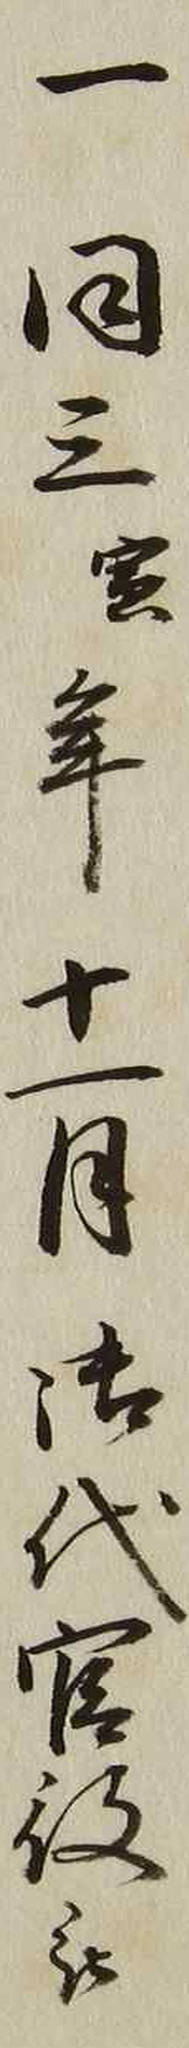一同三寅年十一月御代官役被
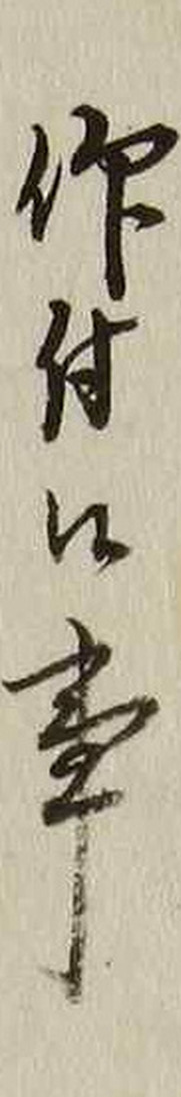仰付候事
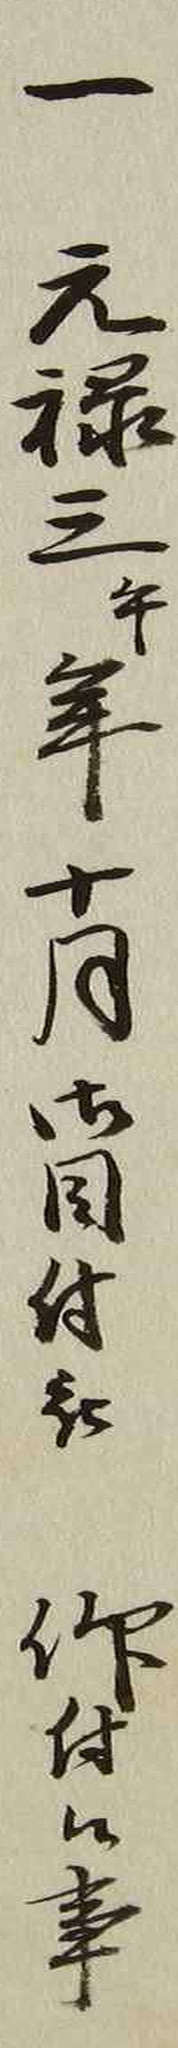一元禄三午年十月御目付被仰付候事
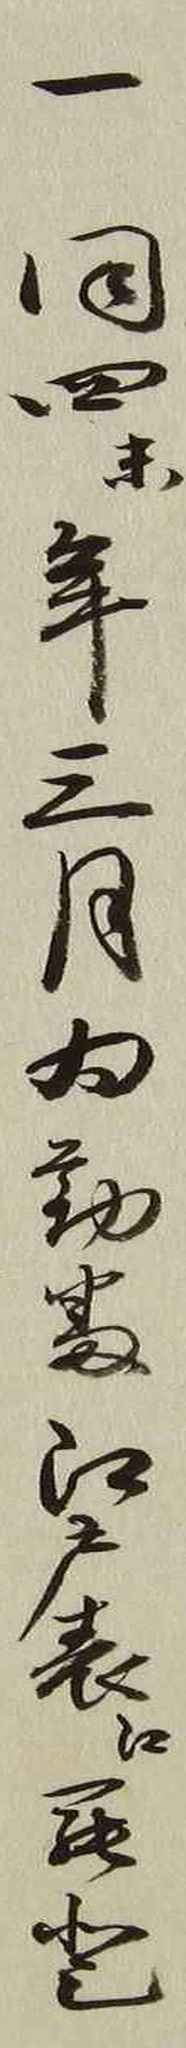一同四未年三月為勤番江摩表江罷登
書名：諸士系譜　巻之149　そ之部2
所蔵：会津若松市立会津図書館
